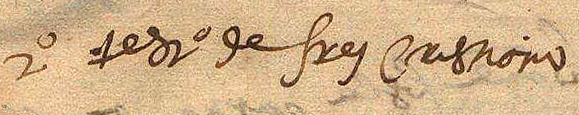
2o testo de frej Cristiano
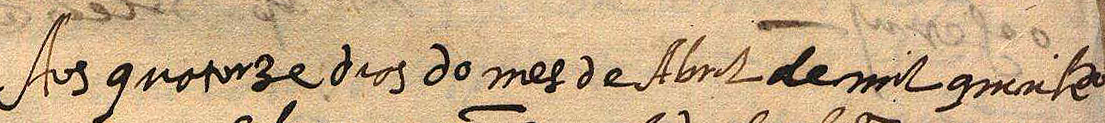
Aos quatorze dias do mes de Abril de mil quinhto
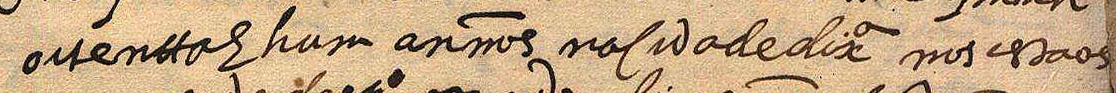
oitentta E hum annos na Cidade dixa nos estaos
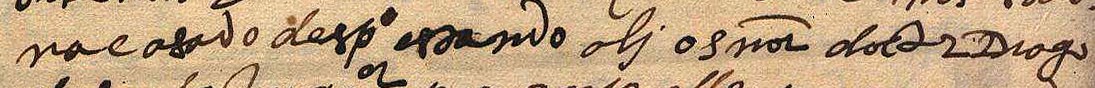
na casa do despo estando alj o snōr doctor Diogo
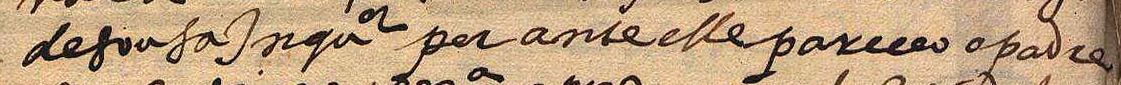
de sousa Jnquor perante elle pareceo o padre
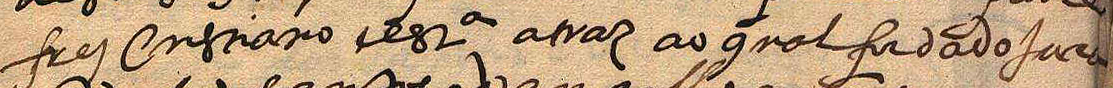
frej Cristiano testa atraz ao qual foi dado Jura
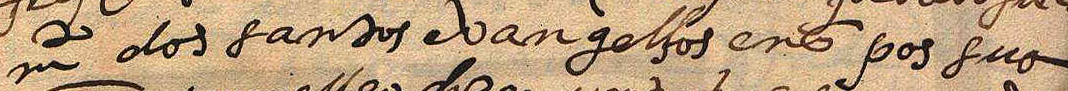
mto dos santos evangelhos en q̄ pos sua
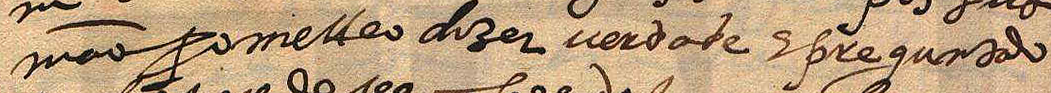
mão ꝓometteo dizer uerdade E preguntado
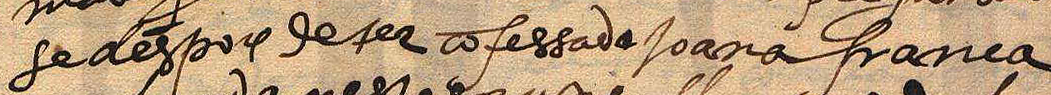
se despois de ter cōfessada Joana franca
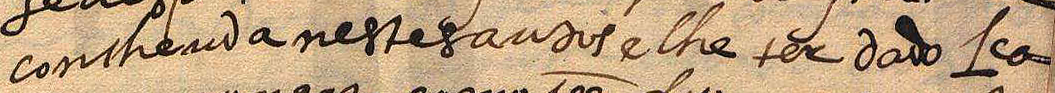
contheuda nestes autos e lhe ter dado Lca
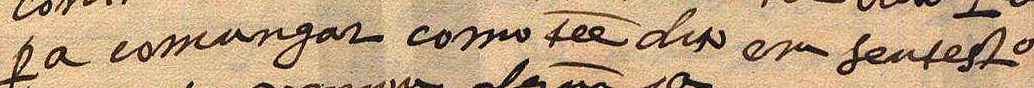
ꝑa comungar como tēe dito em seu testo
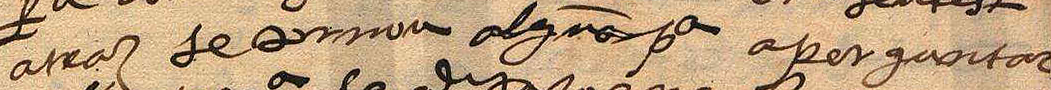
atraz se tornou algūa pa a perguntar
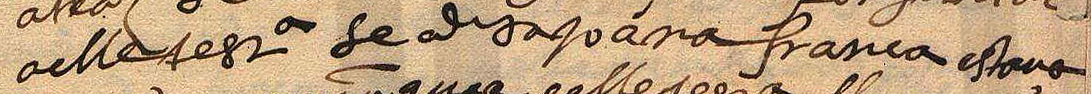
a elle testa se a dita Joana franca estaua
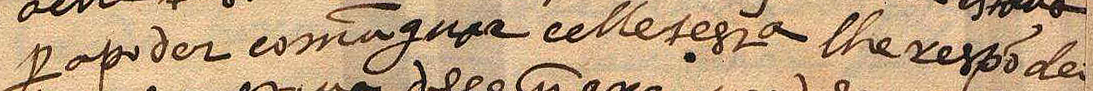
ꝑa poder comūguar e elle testa lhe respōde
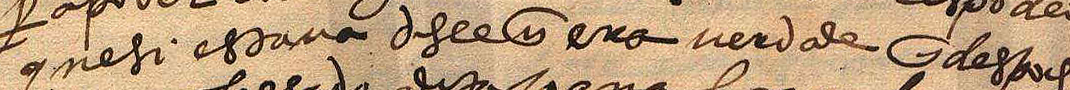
que si estaua disse q̄ era uerdade q̄ despois
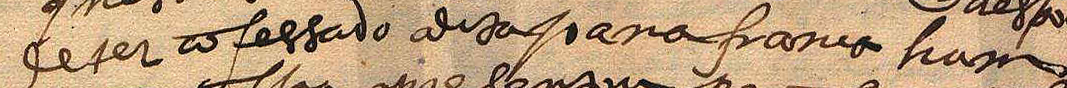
de ter cōfessado dita Joana franca hum
